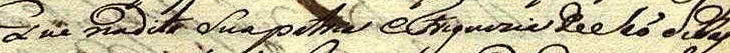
Que na dita sua patria e Freguezia de Saõ Sebas
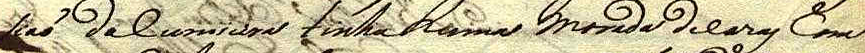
tiaõ da Cumieira tinha huma morada de cazas com
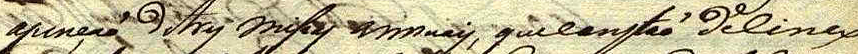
a pençaõ de tres missas a mais, que constaõ de cinco
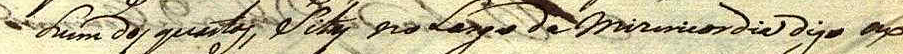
hum dos quartos, sitas no Largo da Mizericordia digo ao
